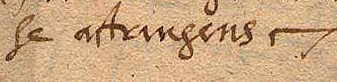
se actringens cꝭ
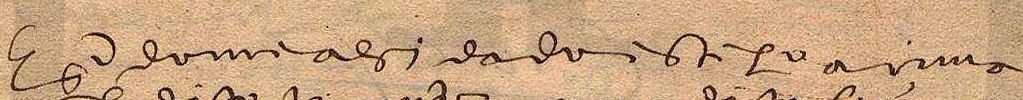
E sēdome ahj dado este Lo açima
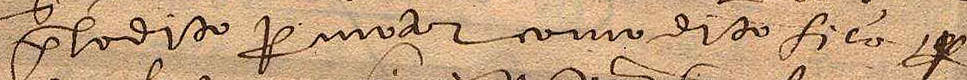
p̄lo djto ꝓmotor como djto fica / ꝑ
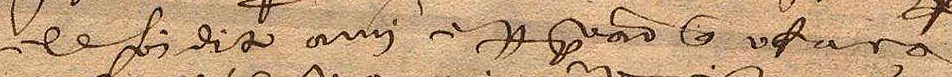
ele foj dito a mj̄ estp̄vão q̄ o faça
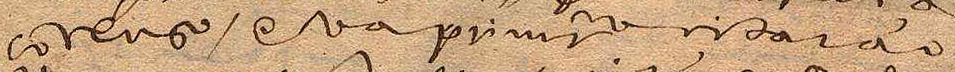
cōcluso / e va primro çitar ao
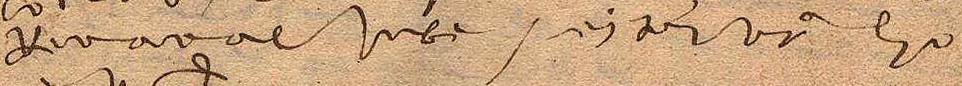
Reo ao alJube / ejtor vra ho
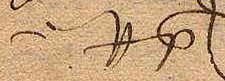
estp̄j
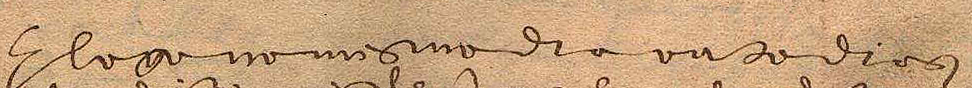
E logo no mesmo dia outo dias
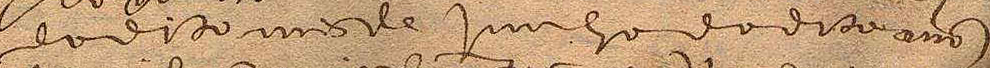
do dito mes de Junho do dito anō
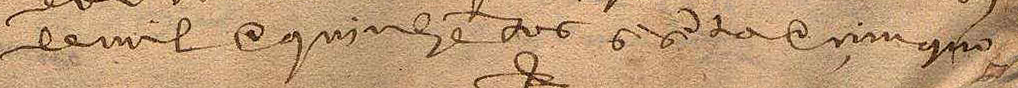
de mil e qujnhētos sesēta e çimquo
